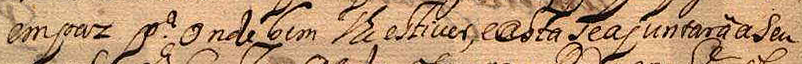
em paz p.a onde bem lhe estiuer, e esta se ajuntarâ a seu
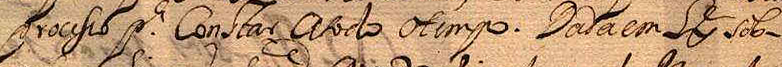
processo p.a constar a todo o tempo. Dada em Lxa sob -
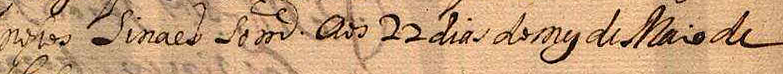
nossos sinaes somte. aos 22 dias do mes de Maio de
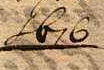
1676
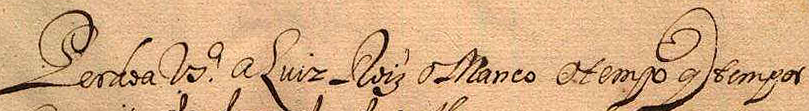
Perdoa Vs.a a Luiz Roiz̄ o Manco o tempo q̄ tem por
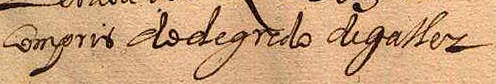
comprir do degredo de gallez
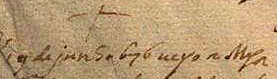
19 de junho 676 ueyo a Mesa,
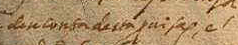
deu conta desta ꝓuisaõ, e
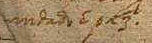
andado ē paz.
